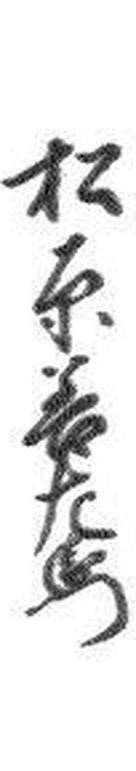松原善左衛門
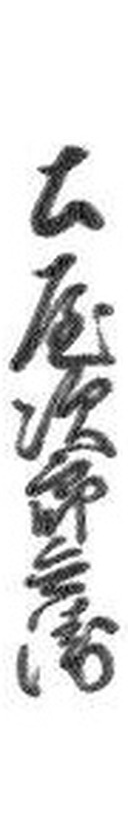土屋次郎兵衛
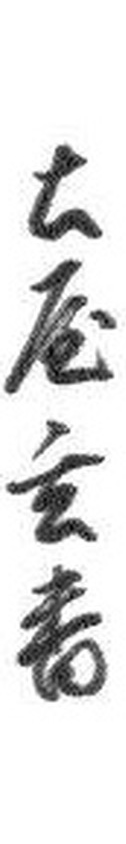土屋玄番

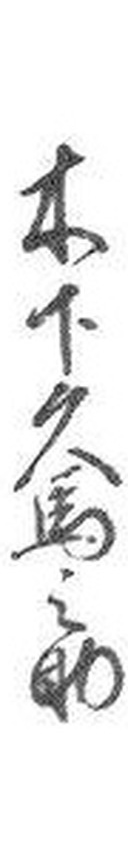木下久馬之助
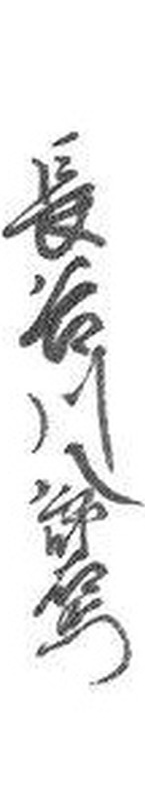長谷川八郎右衛門
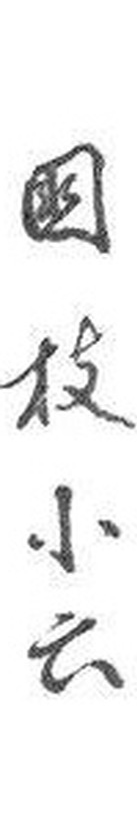国枝小六
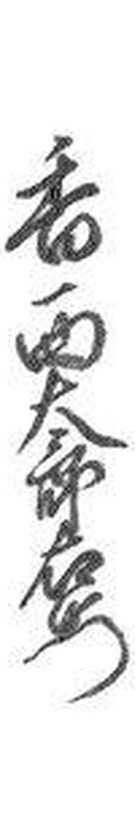香西太郎右衛門
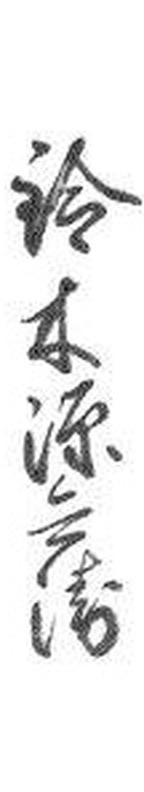鈴木源兵衛
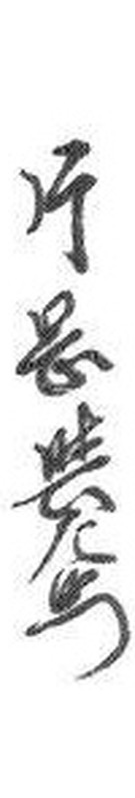片岡与左衛門
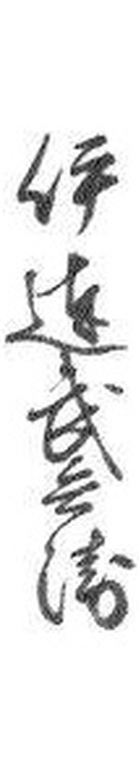伊達武兵衛
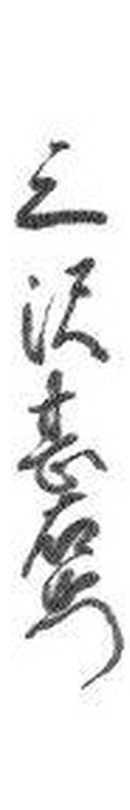三沢甚右衛門
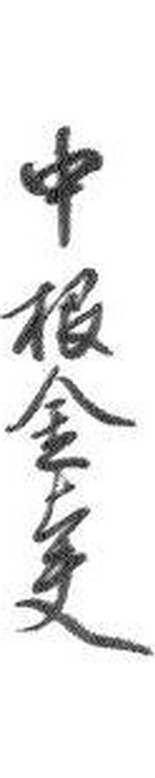中根金太夫
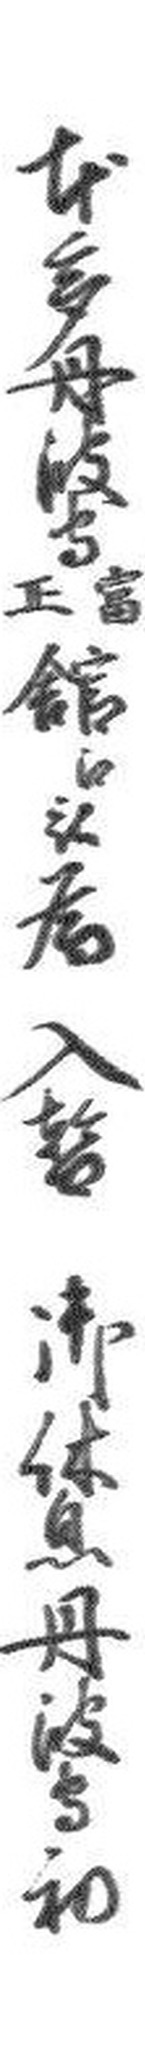本多丹波守富正館江被為入暫御休息丹波守初
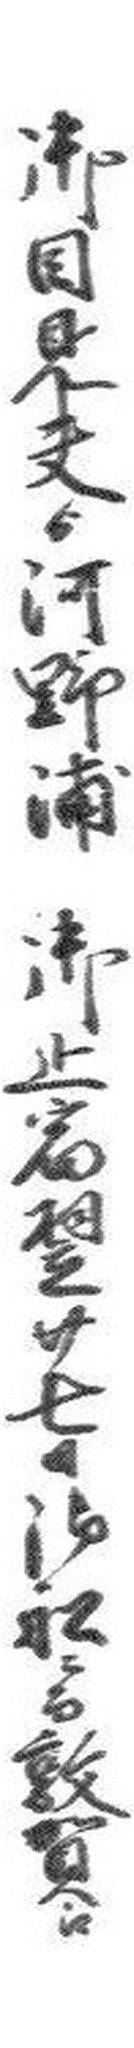御目見夫ゟ河野浦御止宿翌廿七日御舩ニ而敦賀江
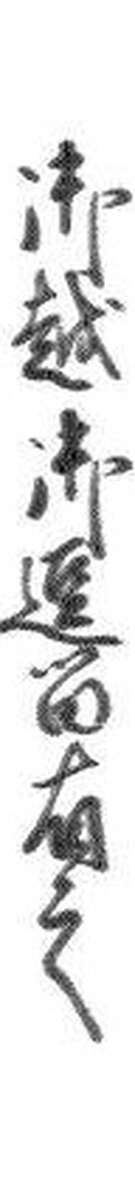御越御逗留有之
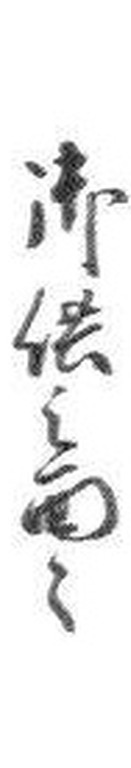御供之面々
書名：家譜 四 忠昌公 従寛永七年到正保四年
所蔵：福井県文書館 Fukui Prefectural Archives
